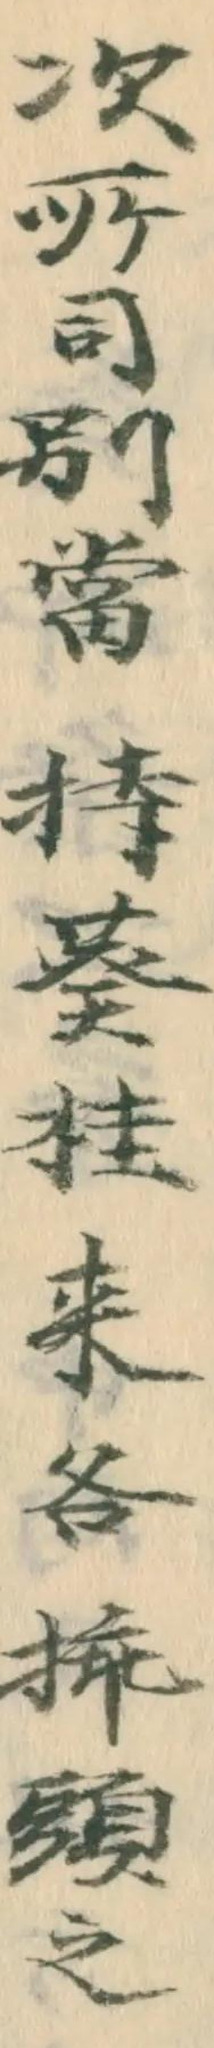次所司別当持葵桂来各挿頭之
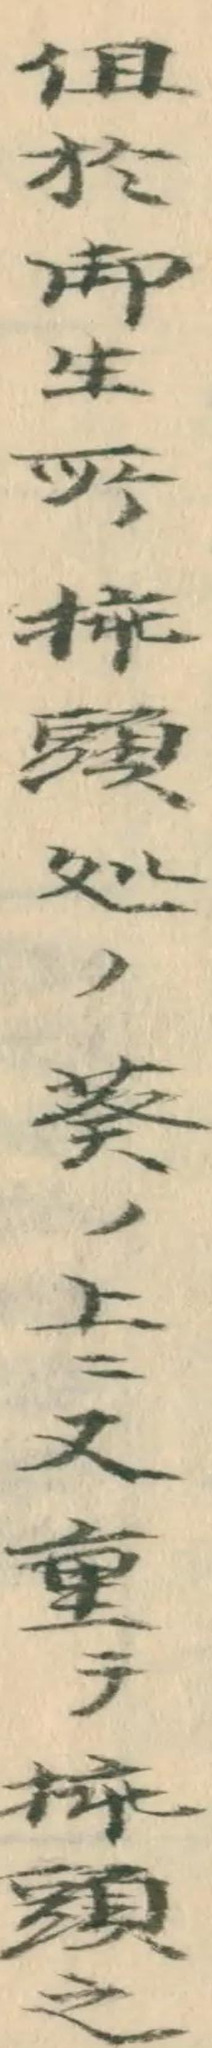但於御生所挿頭処ノ葵ノ上ニ又重テ挿頭之
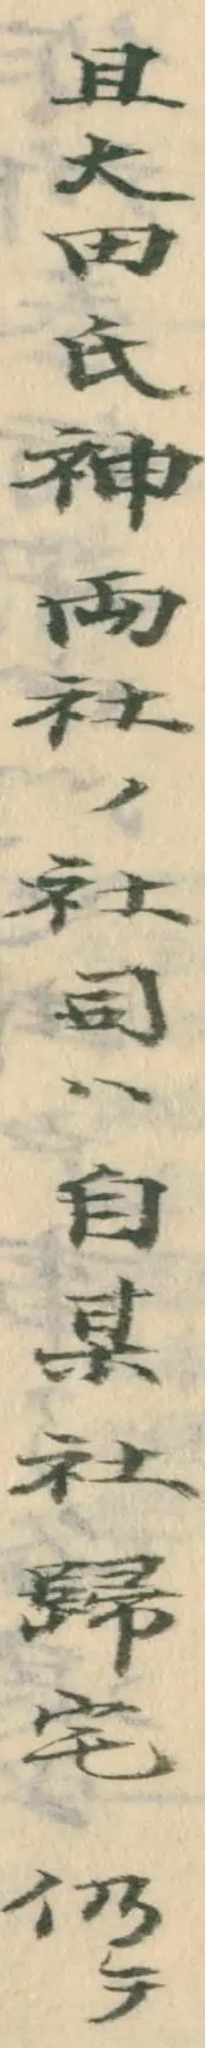且大田氏神両社ノ社司ハ自某社帰宅仍テ
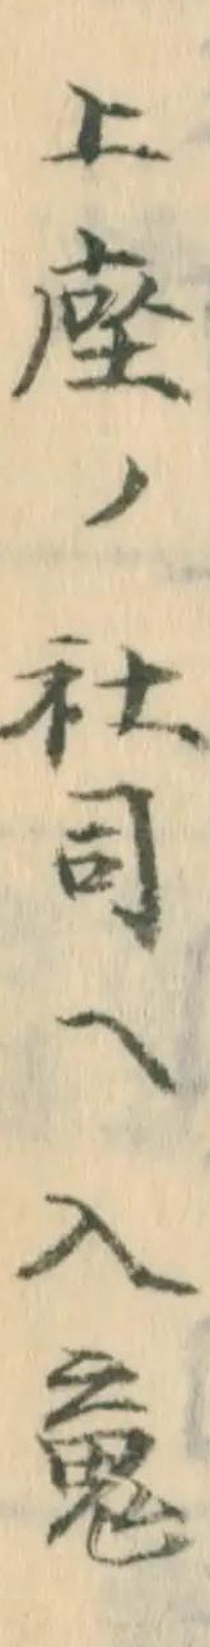上座ノ社司へ入魂

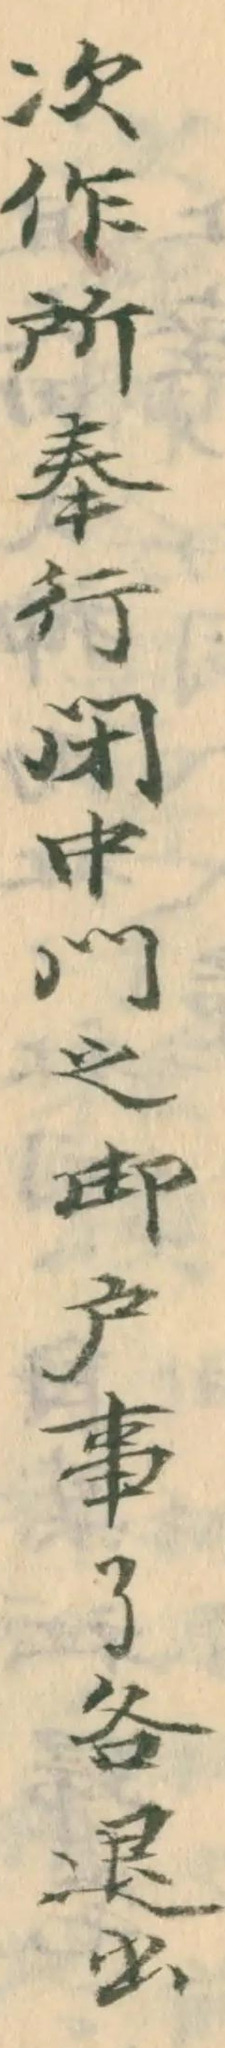次作所奉行閉中門之御戸事了各退出
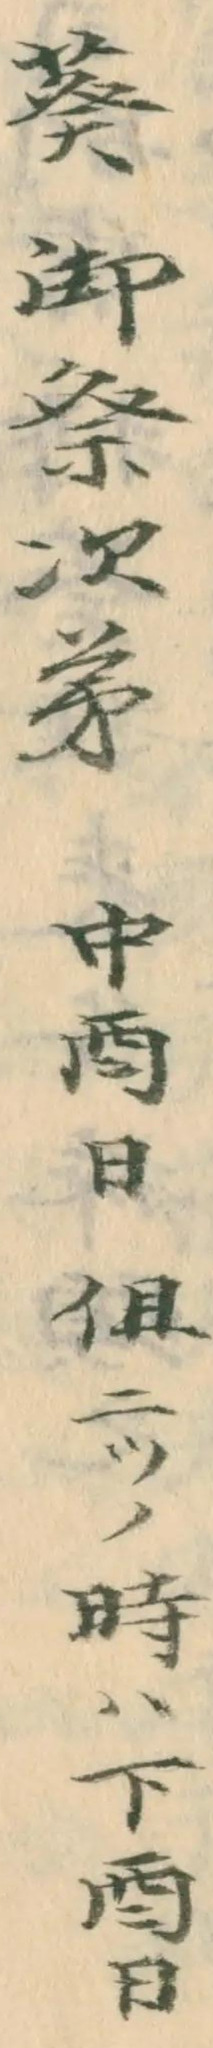葵御祭次第中酉日但二ツノ時ハ下酉日

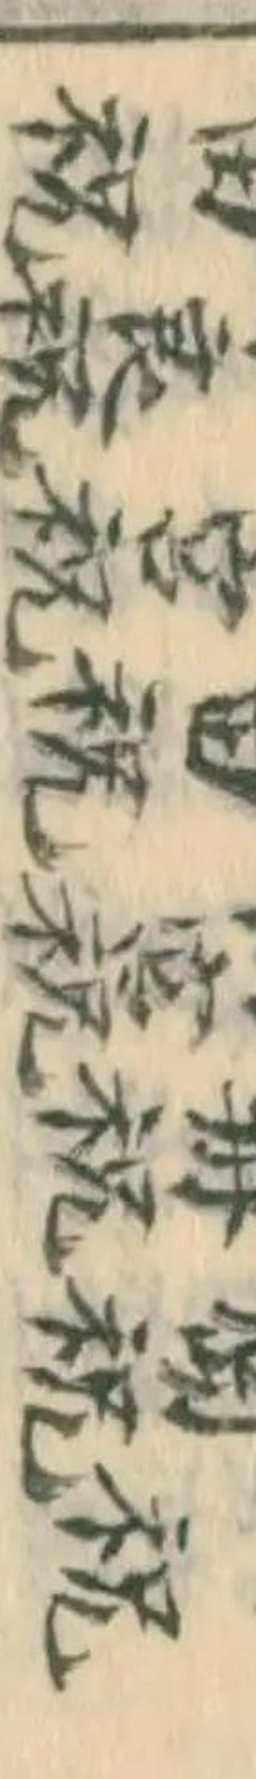祝祝祝祝祝祝祝祝

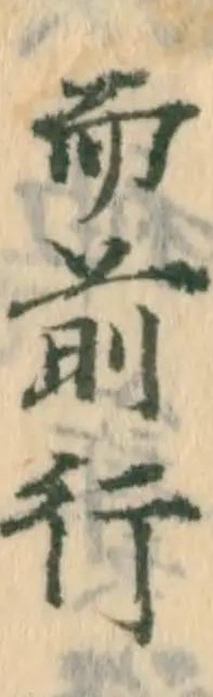而前行
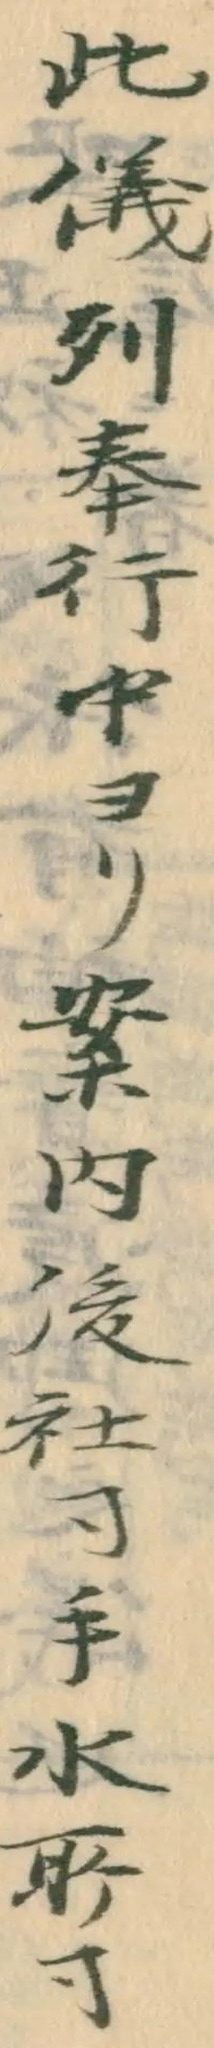此儀列奉行中ヨリ案内後社司手水所司
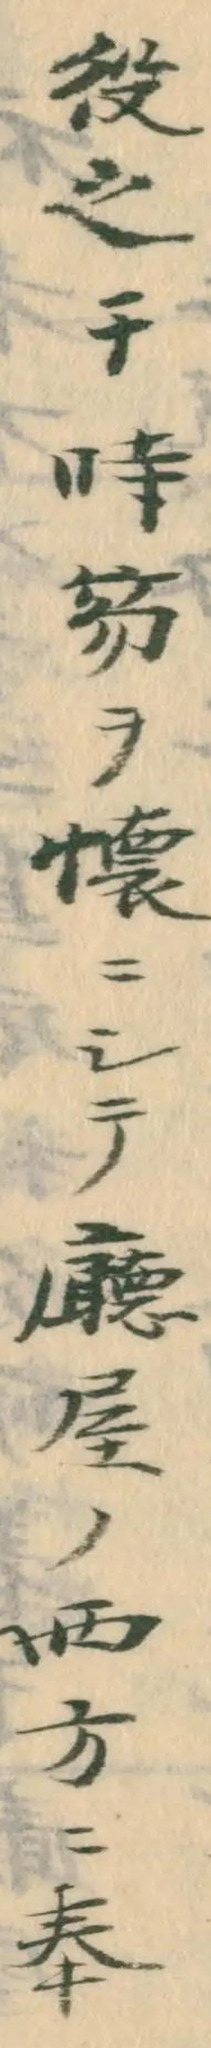役之于時笏ヲ懐ニシテ庁屋ノ西方ニ奉
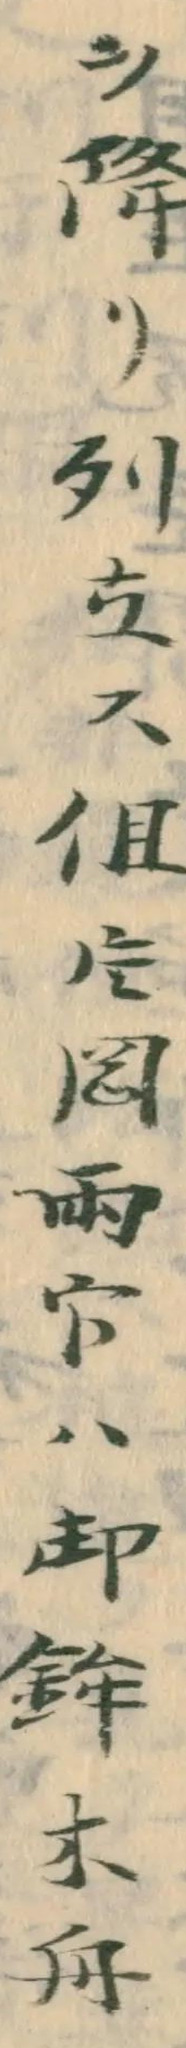ヲ降リ列立ス但片岡両官ハ御鉾木舟
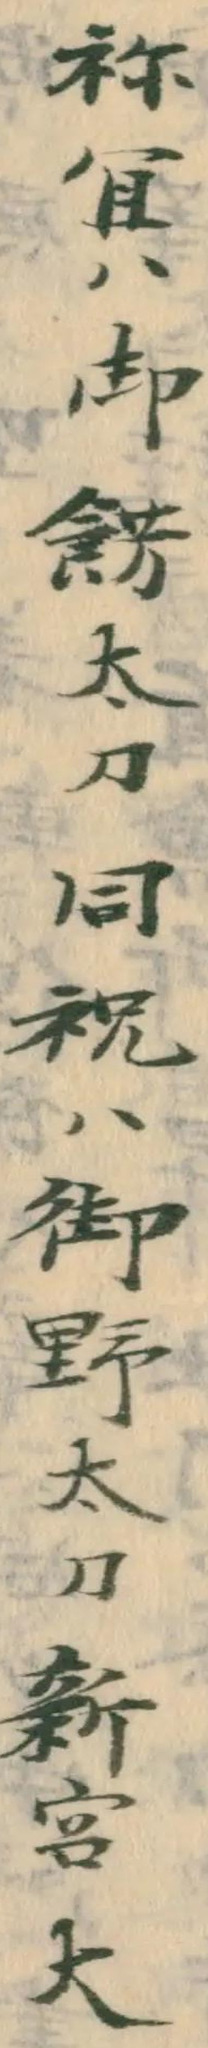禰宜ハ御餝太刀同祝ハ御野太刀新宮大
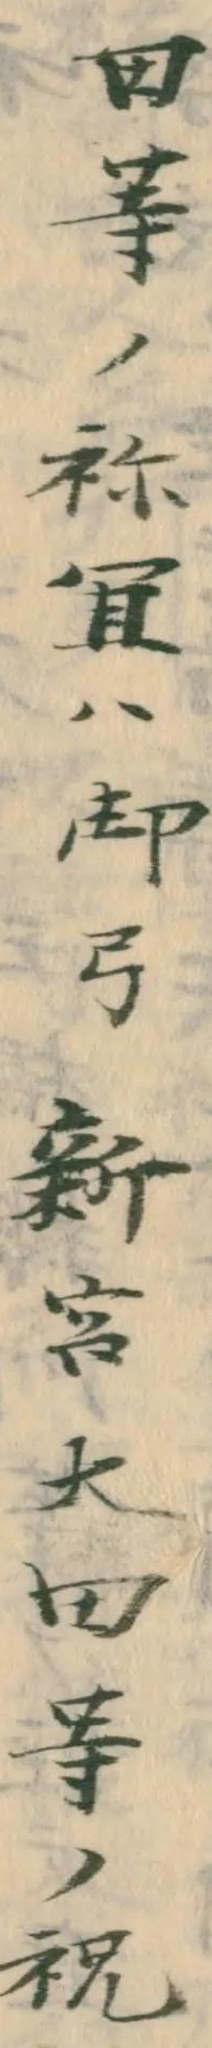田等ノ禰宜ハ御弓新宮大田等ノ祝
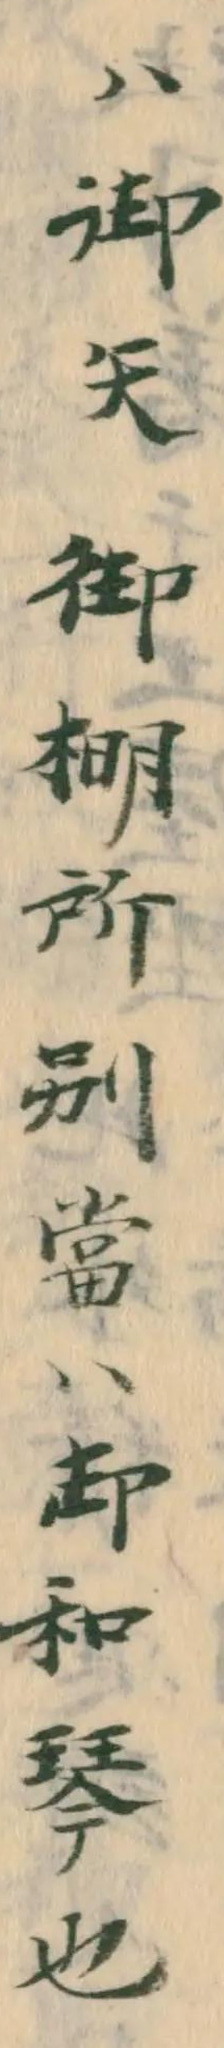ハ御矢御棚所別当ハ御和琴也
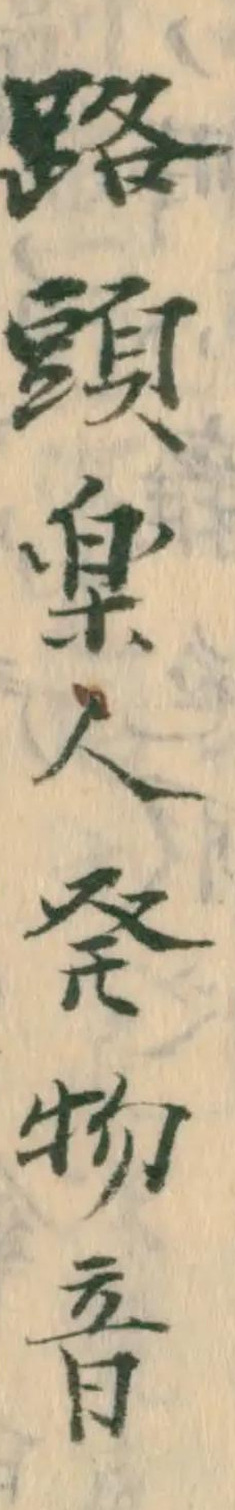路頭楽人発物音
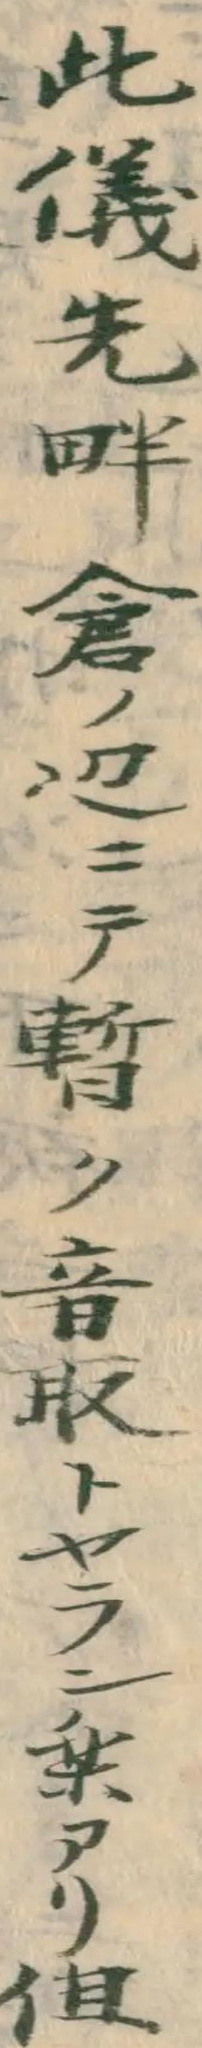此儀先畔倉ノ辺ニテ暫ク音取トヤラン楽アリ但
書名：賀茂社記録. 第5冊
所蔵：国立国会図書館 National Diet Library, JAPAN
